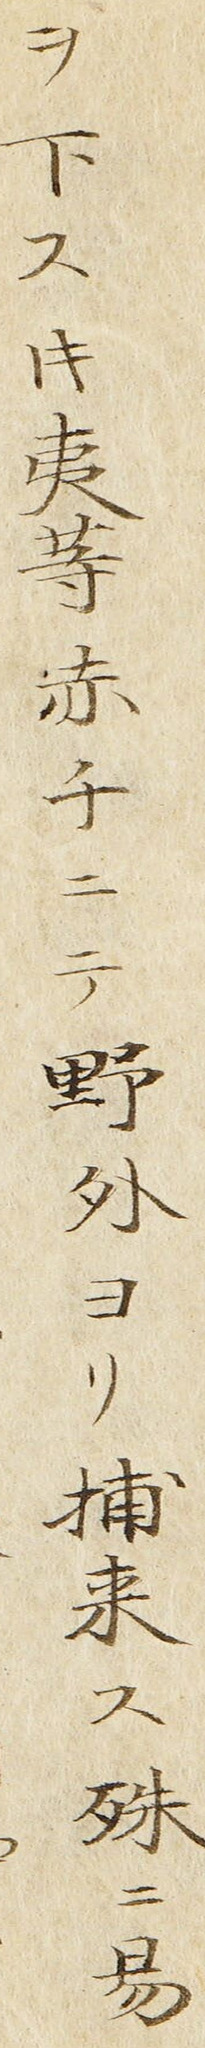ヲ下ス夷赤チニテ野外ヨリ捕来ス殊ニ易
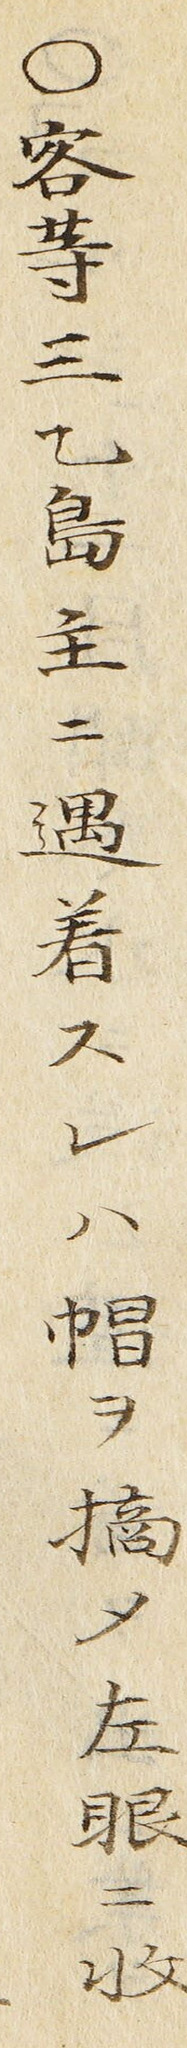〇客等三乙島主ニ遇着スレハ帽ヲ摘メ左眼ニ
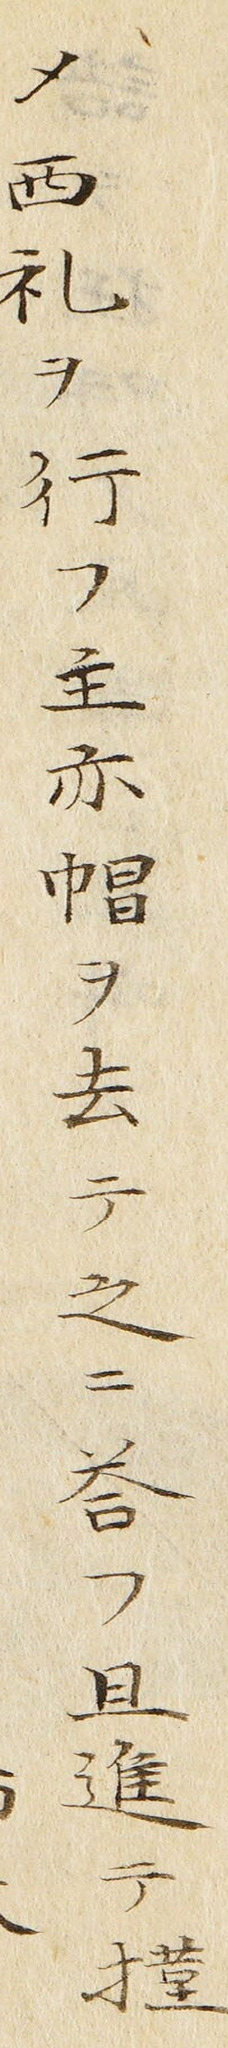メ西礼ヲ行フ主亦帽ヲ去テ之ニ誉フ且進テ
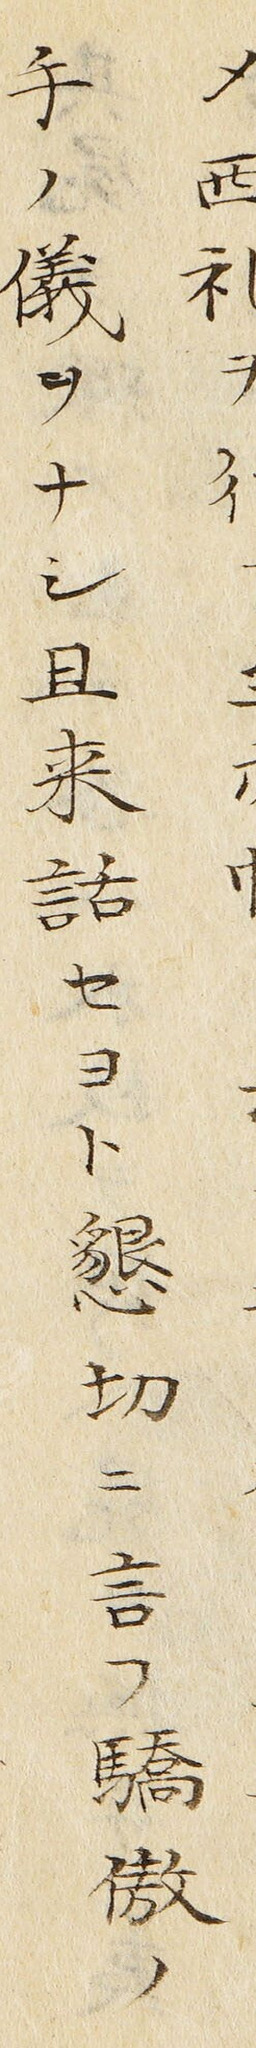手ノ儀ヲナシ且来話せヨト懇孔功ニ言フ驕傲ノ
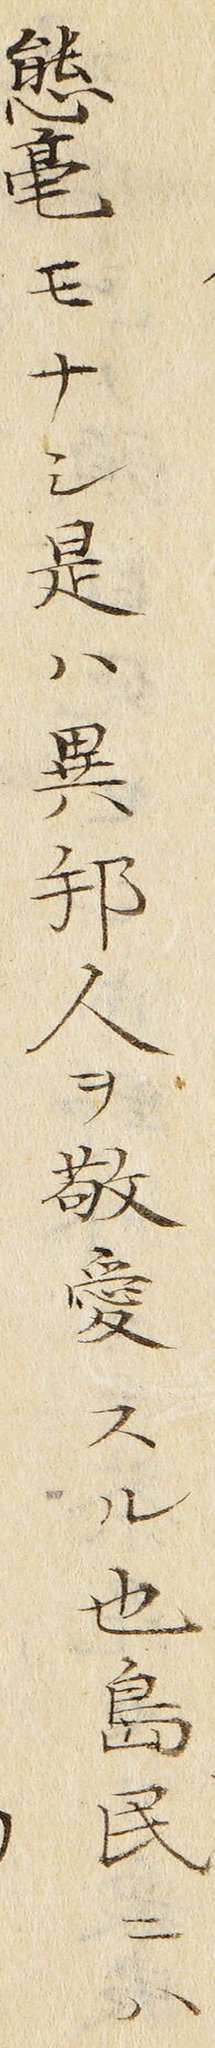態モナシ是ハ異邦人ヲ敬愛スル也島民ニハ
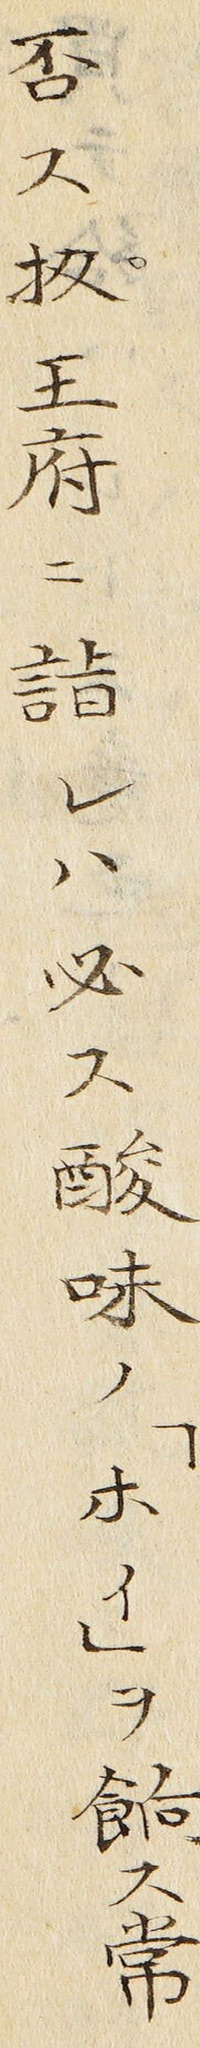否ス王府ニレハかｎ必ス酸味ノ「ホイ」ヲス常
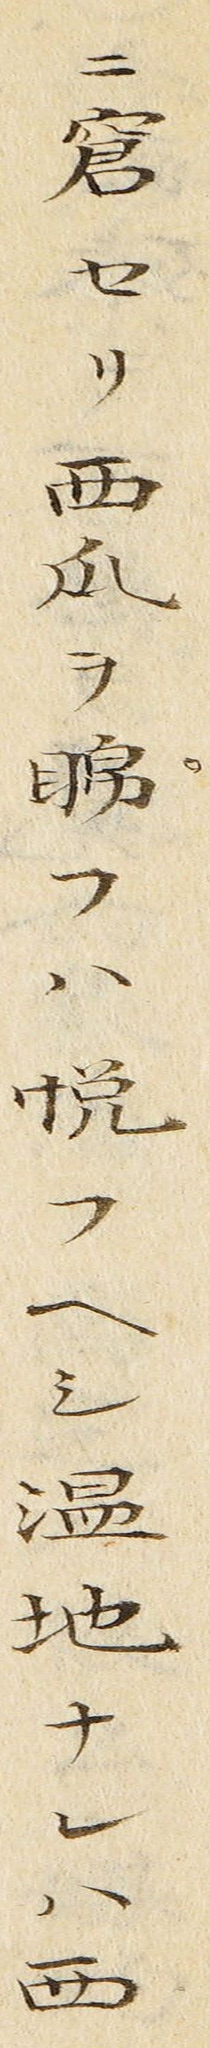ニセリ西瓜ヲフハ悦フヘシ温地ナレハ西
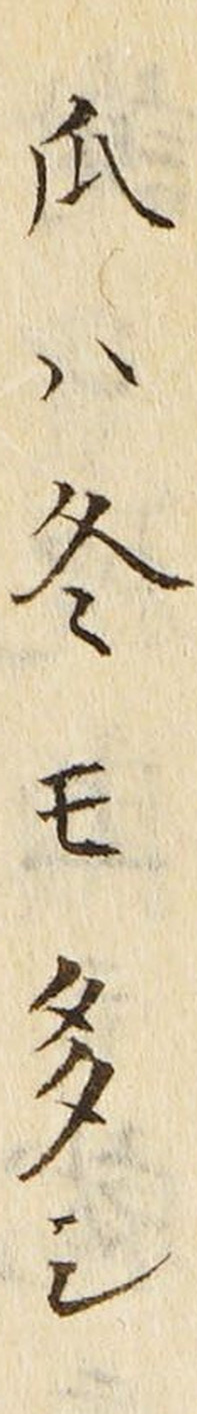瓜ハ冬モ多シ
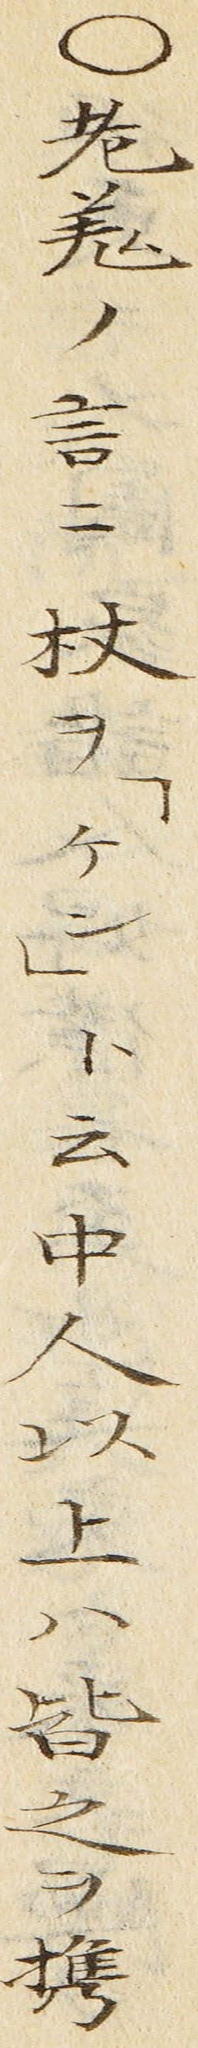〇老ノ言ニ杖ヲ「ケン」ト云中人以上ハ皆之ヲ携
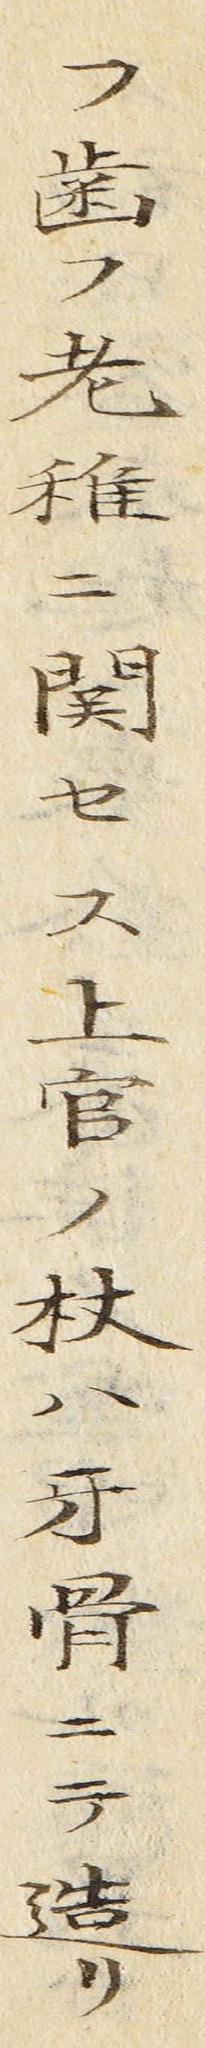フ歯フ老稚ニ関セス上官ノ杖ハ牙骨ニテ造リ
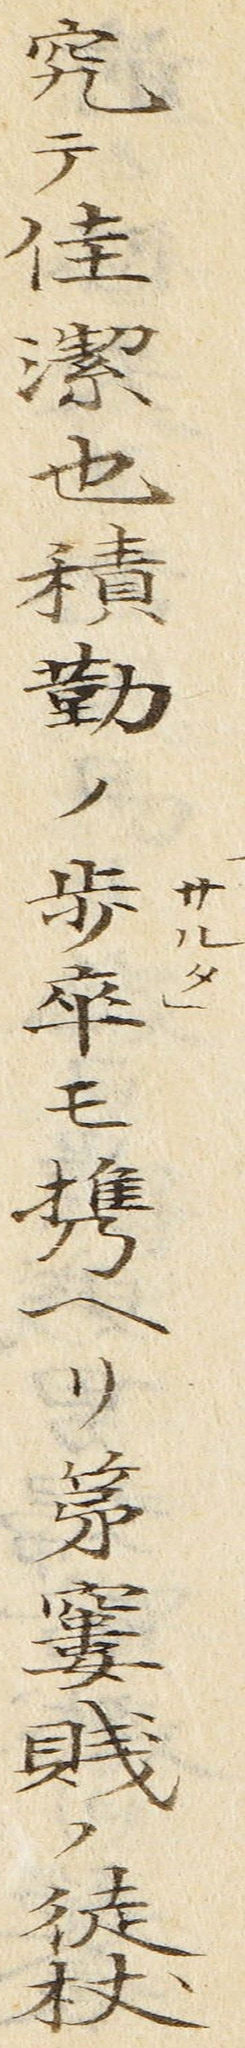究テ佳潔也石積ノ歩卒モ携ヘリ賎ノ徒杖
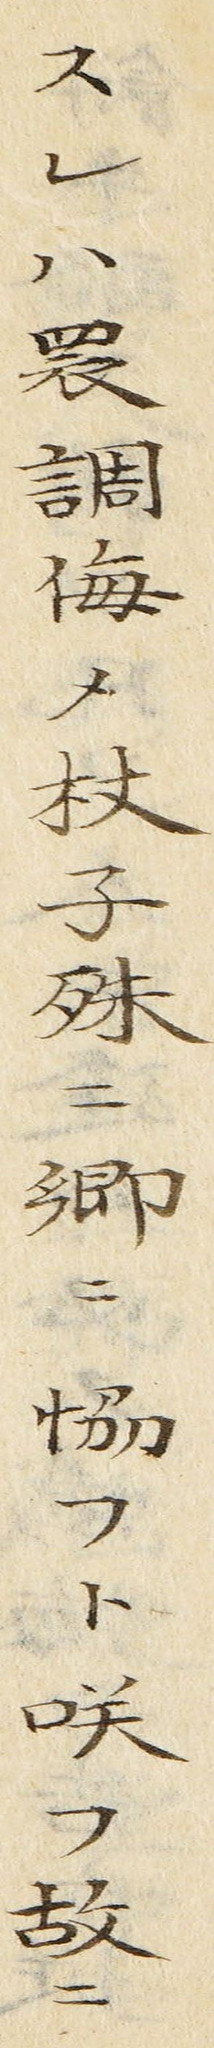スレハ調悔メ杖子殊ニ郷ニフト咲ヲ故ニ
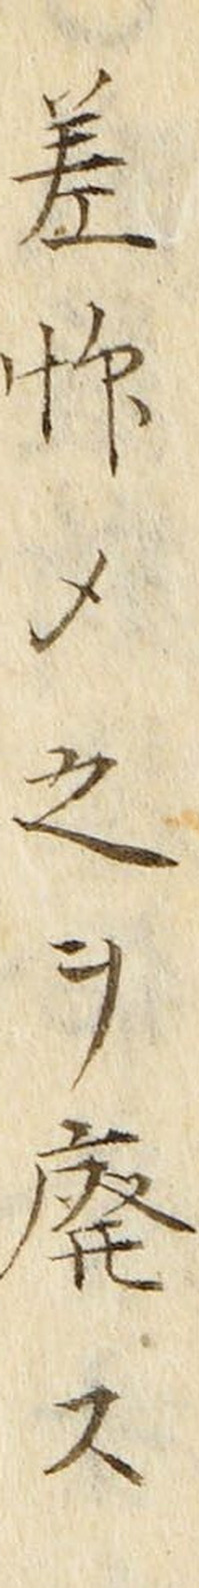差メ之ヲ廃ス
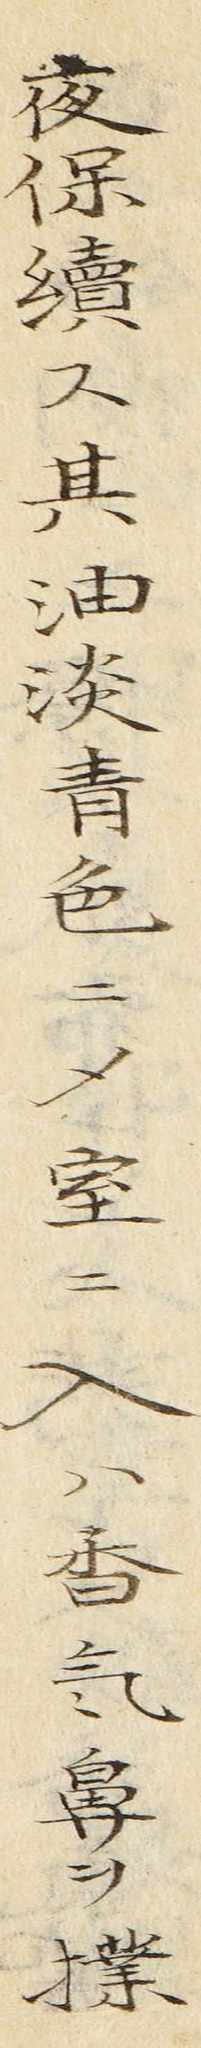夜帆保しス其油淡青色ニメ入ハ香気鼻ヲ
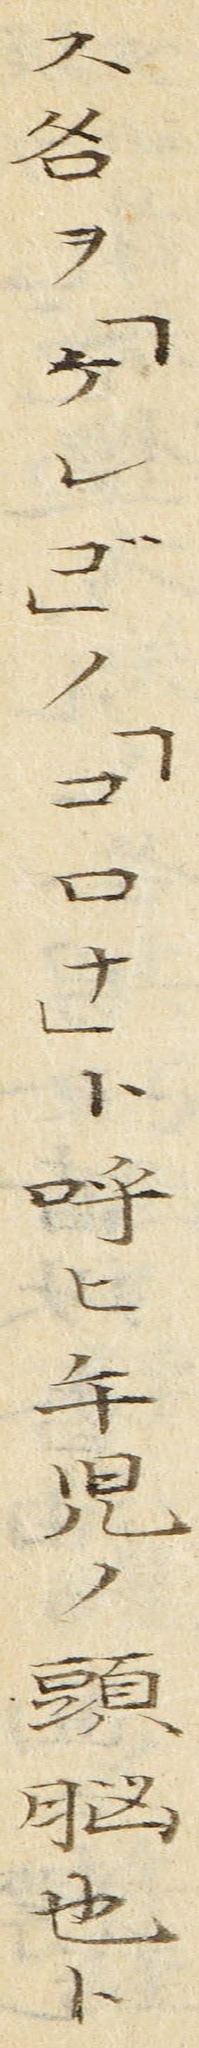ス各ヲ「ケレゴ」ノ「コロナ」ト呼ヒ午児ノ頭脳也ト
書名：流蕃通書
